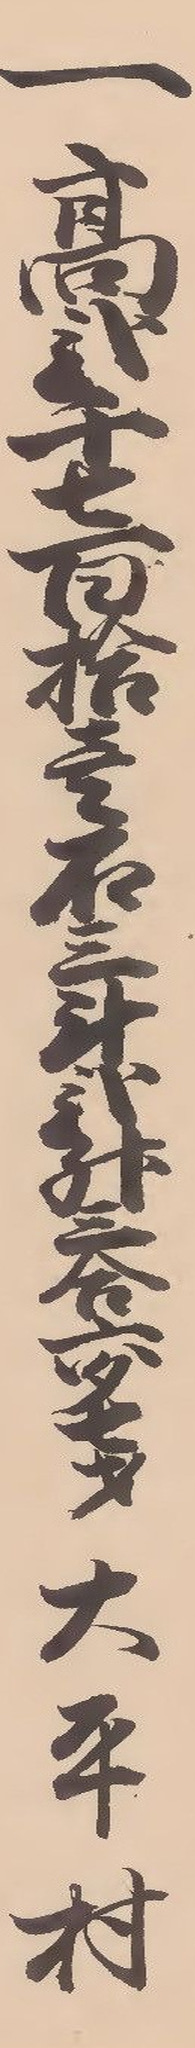一高弐千七百拾壱石三斗弐升三合六勺七才大平村
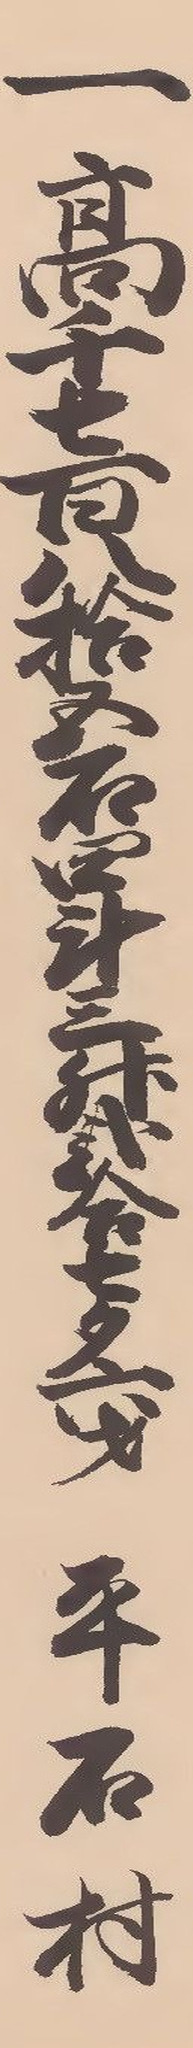一高千七百八拾五石四斗三升弐合七勺六才平石村
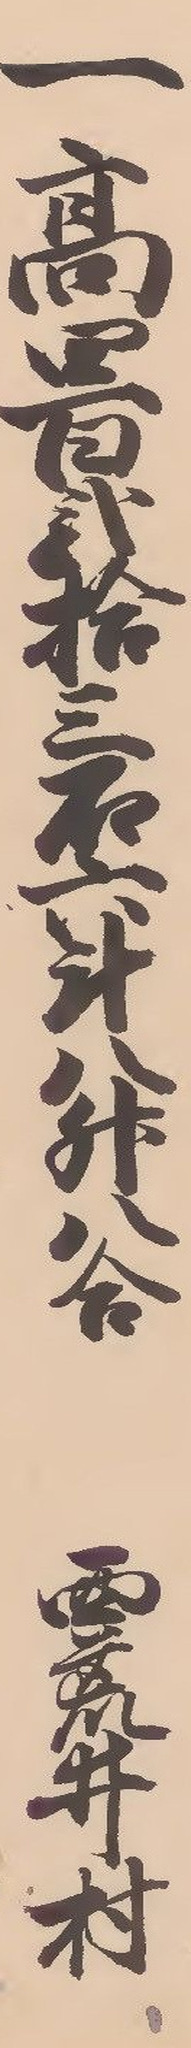一高四百弐拾三石六斗八升八合西荒井村

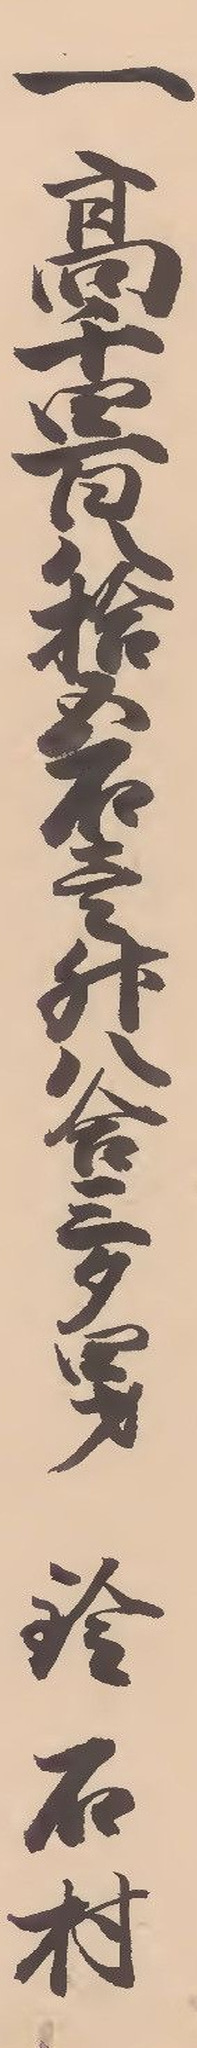一高千四百八拾五石壱升八合三勺四才鈴石村
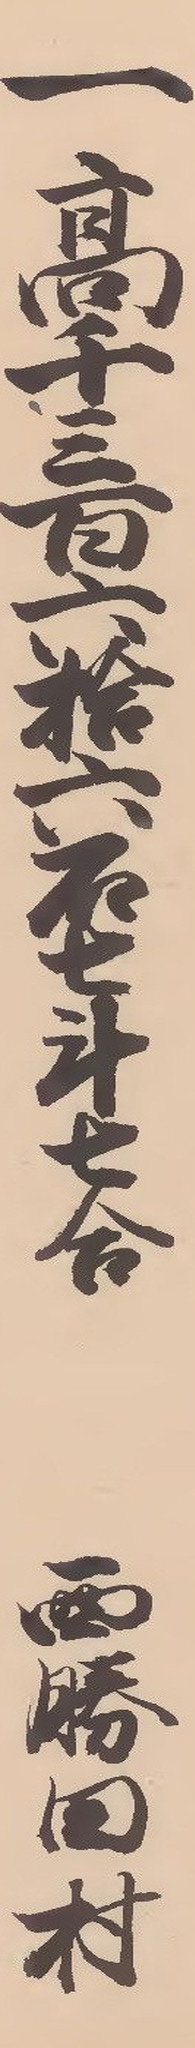一高千三百六拾六石七斗七合西勝田村
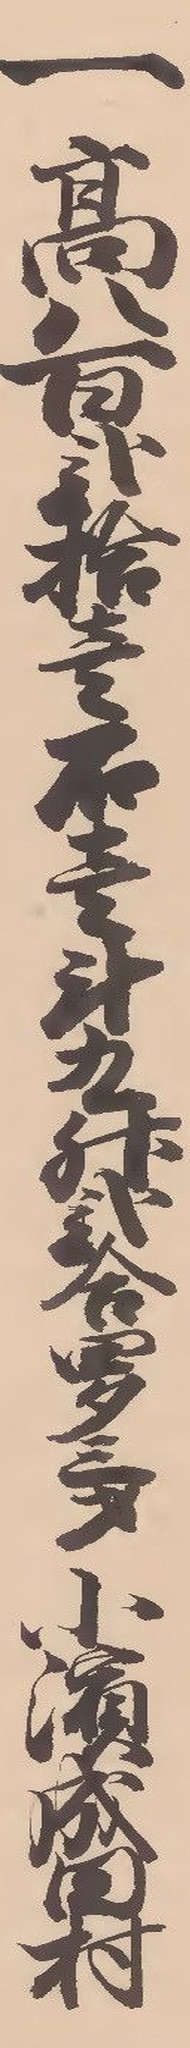一高八百弐拾壱石壱斗九升弐合四勺三才小浜成田村
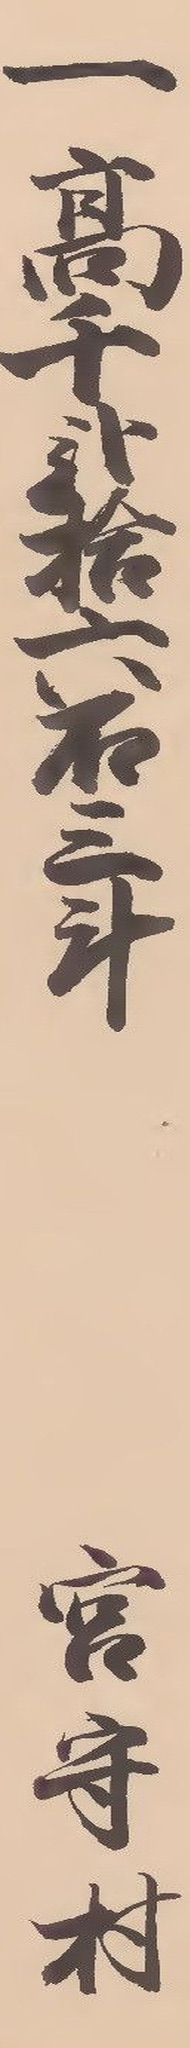一高千弐拾六石三斗宮守村
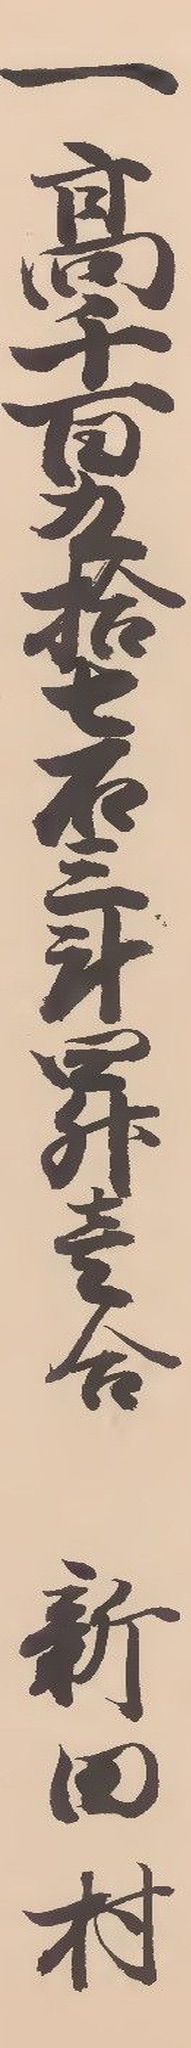一高千百九拾七石三斗四升壱合新田村
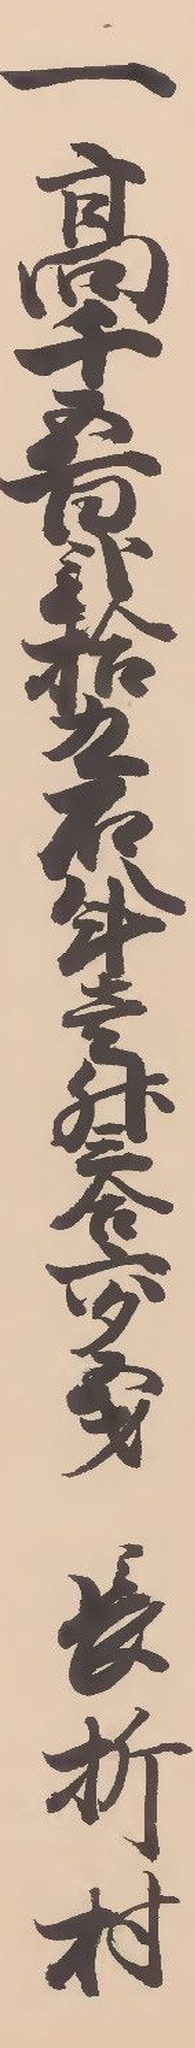一高千五百弐拾九石八斗壱升三合六勺五才長折村
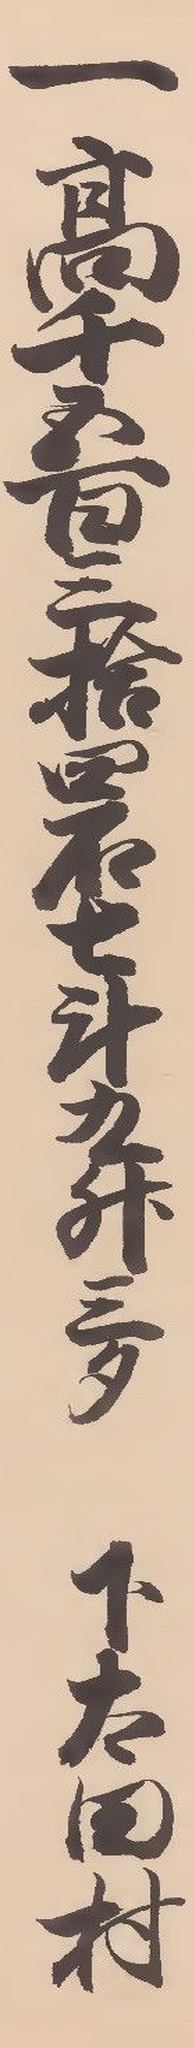一高千五百三拾四石七斗九升三勺下太田村
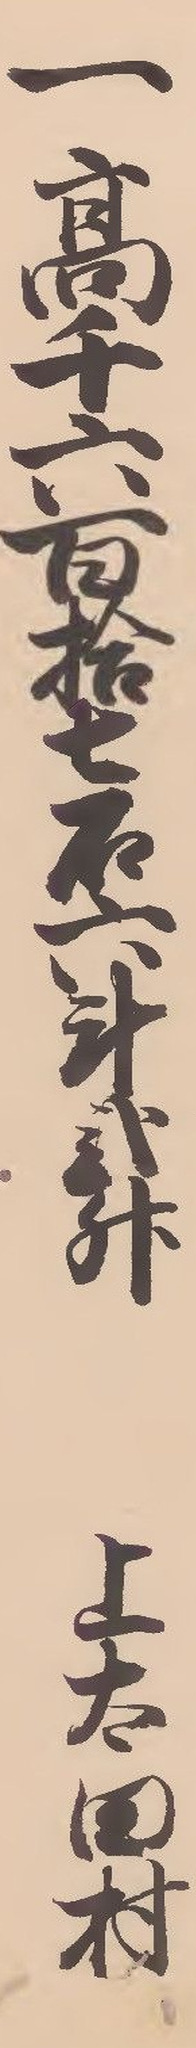一高千六百拾七石六斗弐升上太田村

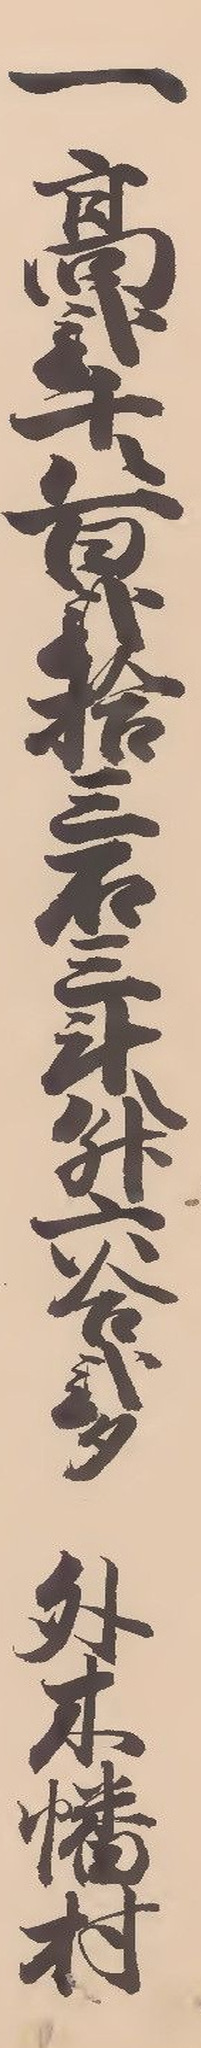一高弐千八百弐拾三石三斗升六合弐勺外木幡村
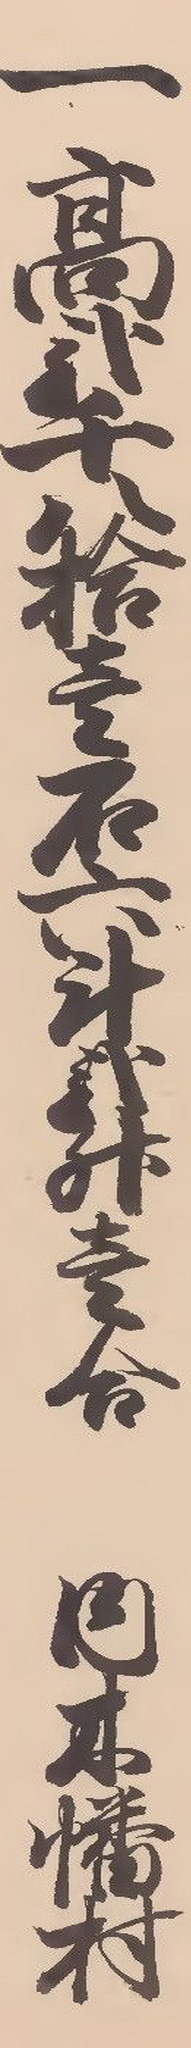一高弐千八拾壱石六斗弐升壱合内木幡村
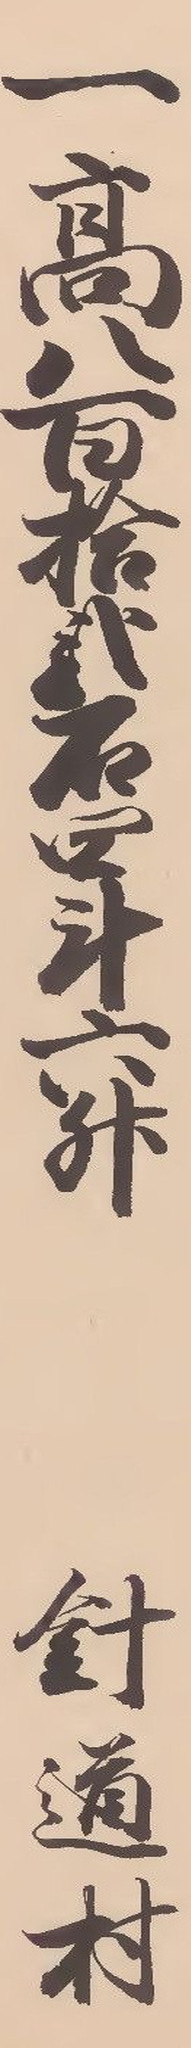一高八百拾弐石四斗六升針道村
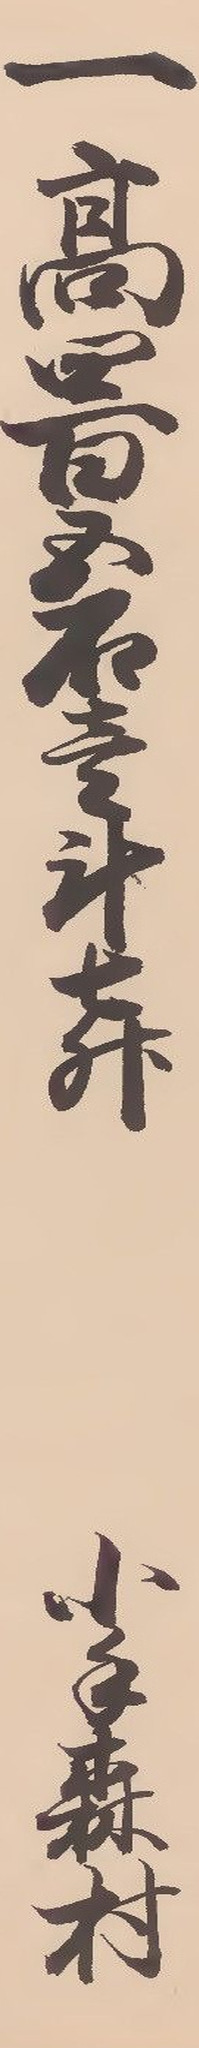一高四百五石壱斗七升小手森村
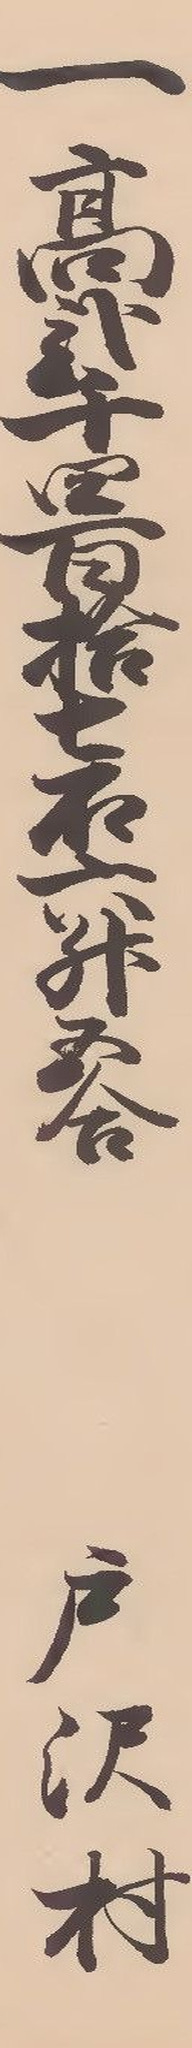一高弐千四百拾七石六升五合戸沢村
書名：陸奥国郷帳　２
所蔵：国立公文書館 National Archives of Japan
